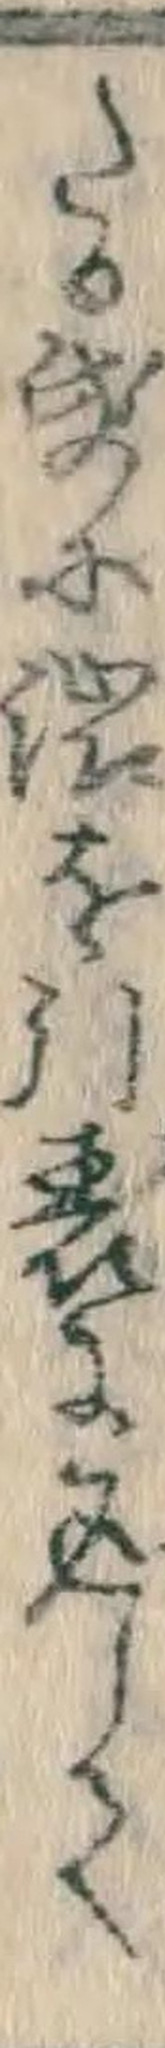たる紙に渋を引表に返して
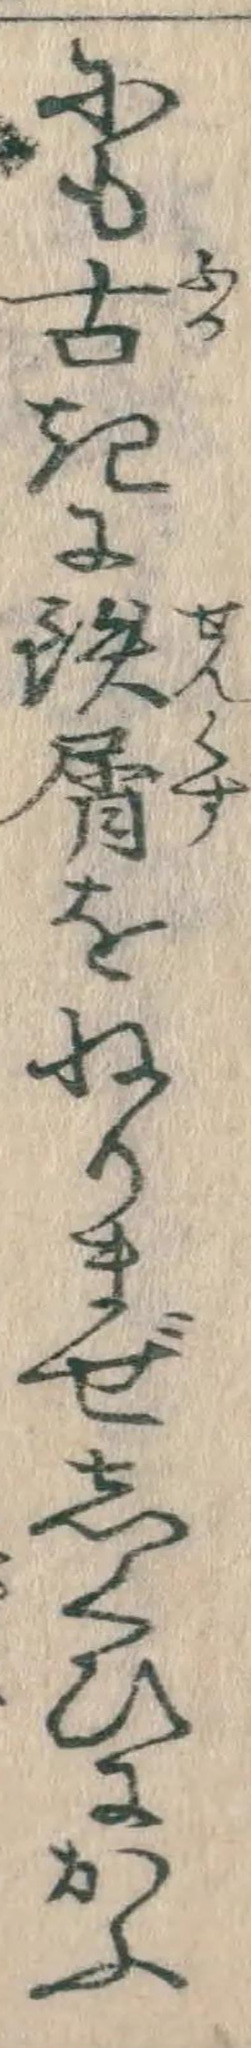にも古きに銑屑をねりまぜしくひにかふ
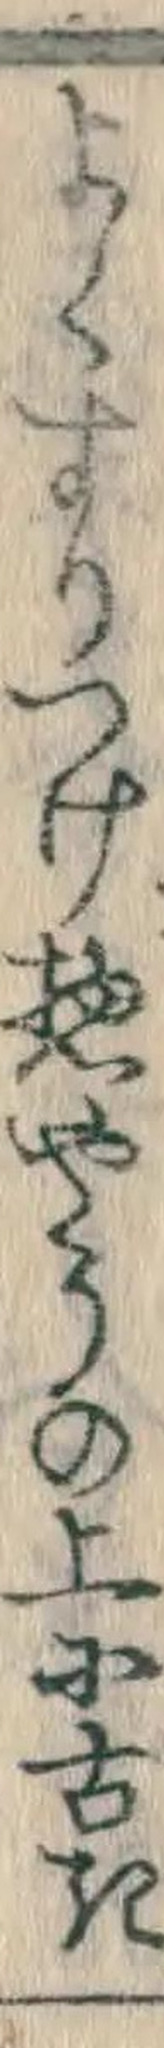よくすりつけ惣やうの上に古き
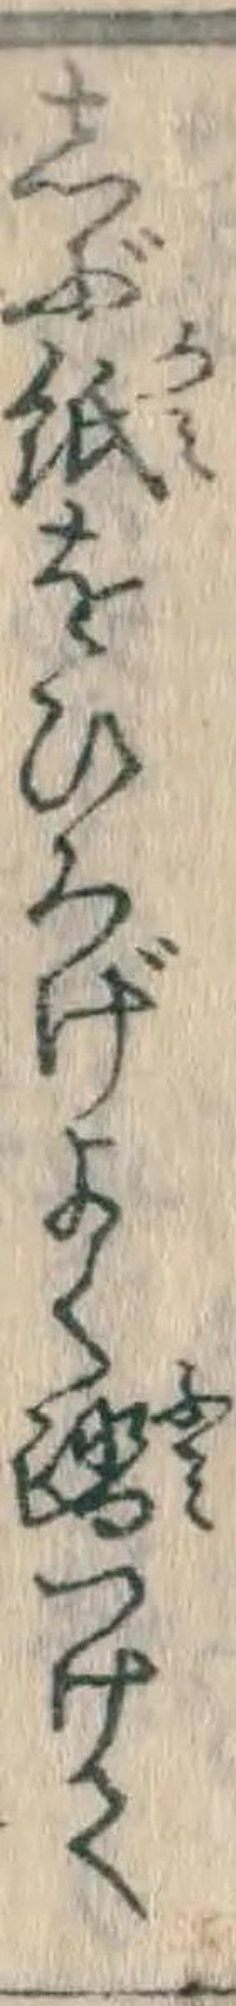しぶ紙をひろげよく踏つけて
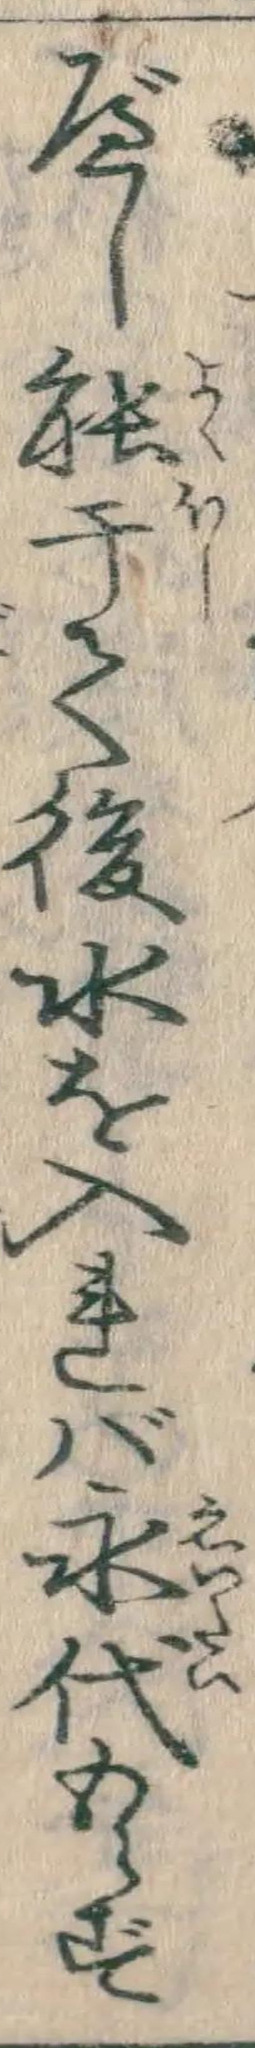べし能干て後水を入れば永代もらず
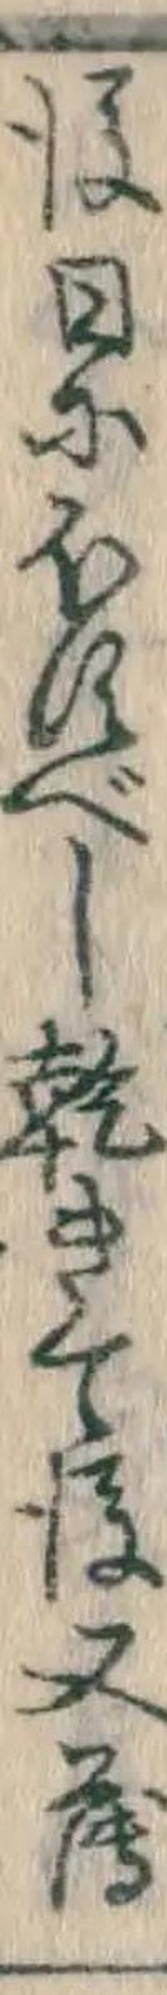後日にほすべし乾きて後又薄
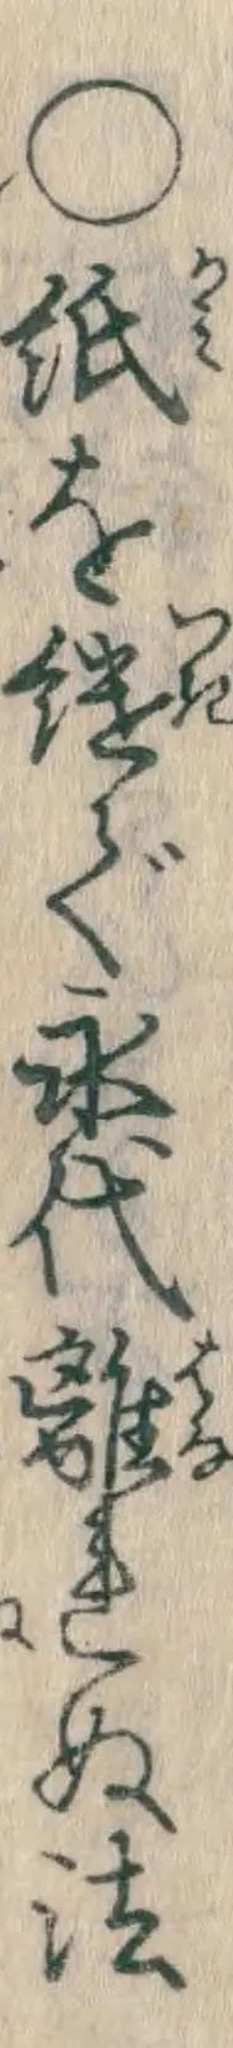○紙を継で永代離れぬ法
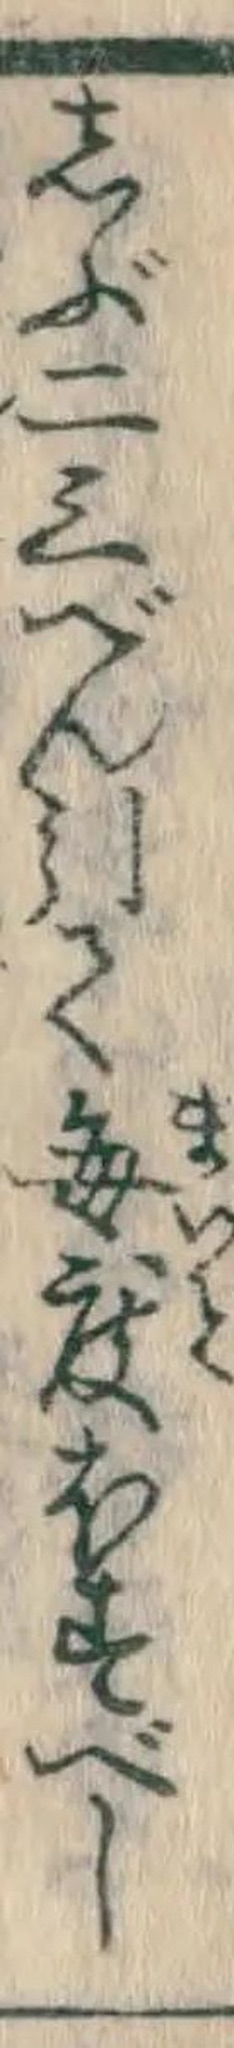しぶ二三べん引て毎度ほすべし
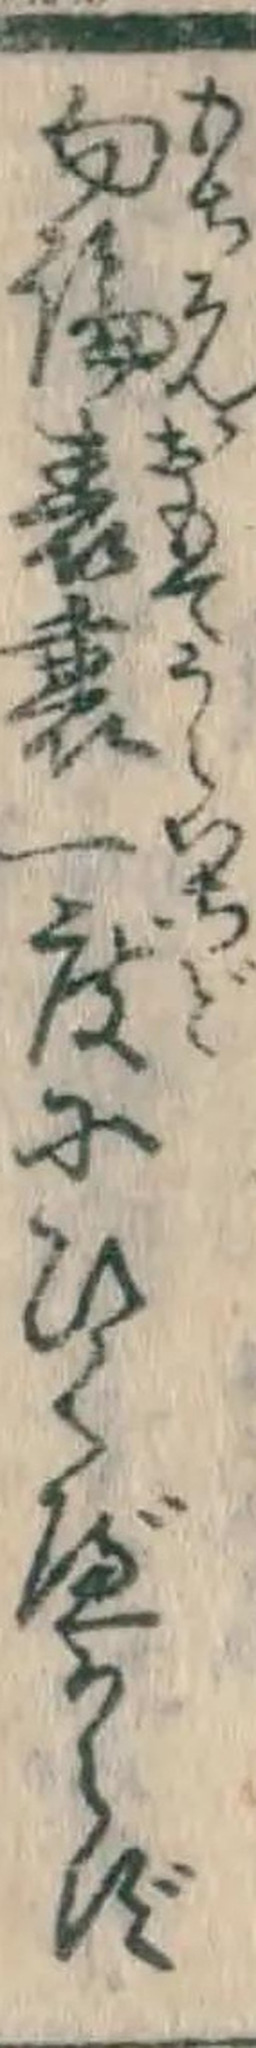勿論表裏一度にひくべからず
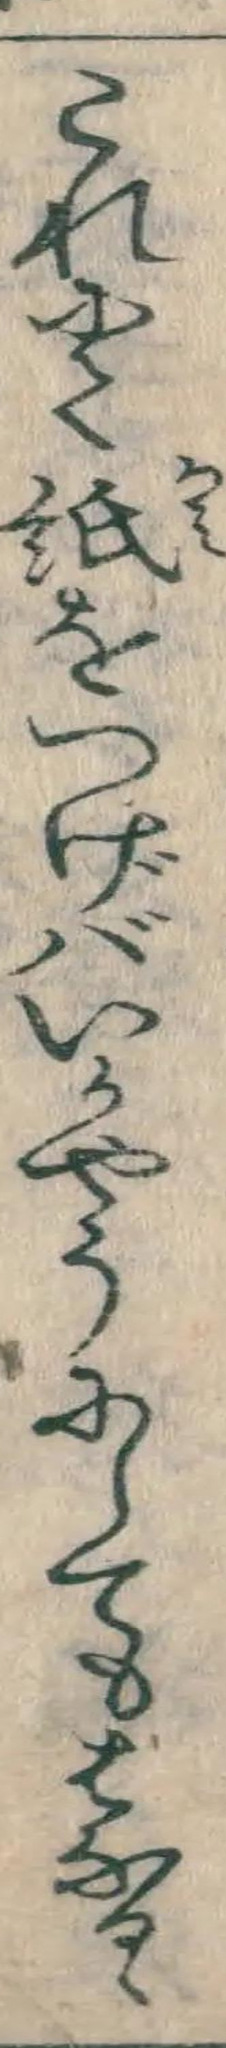これにて紙をつげばいかやうにしてもはなるゝ
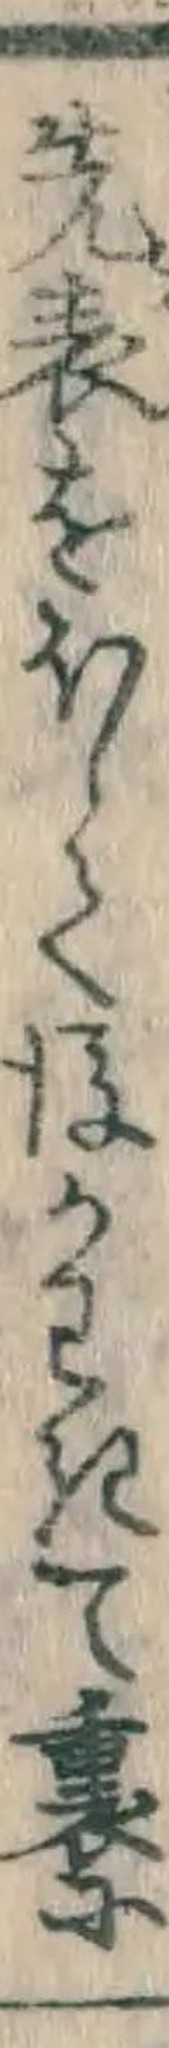先表をほして後かわきて裏に
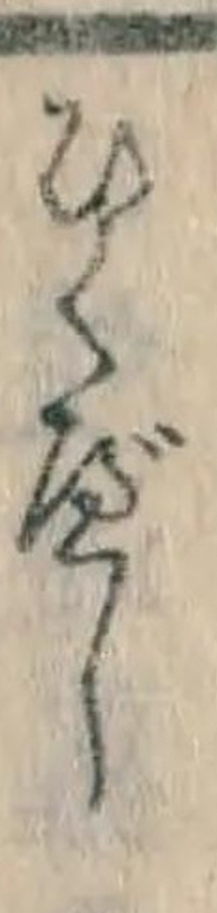ひくべし
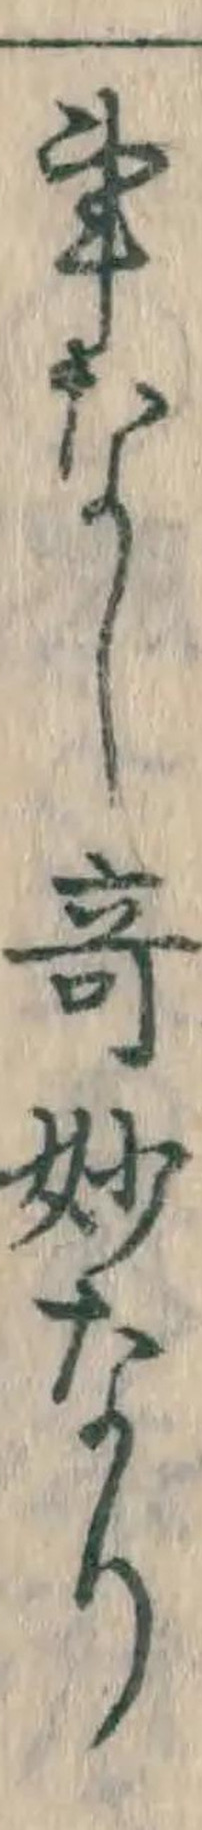事なし奇妙なり

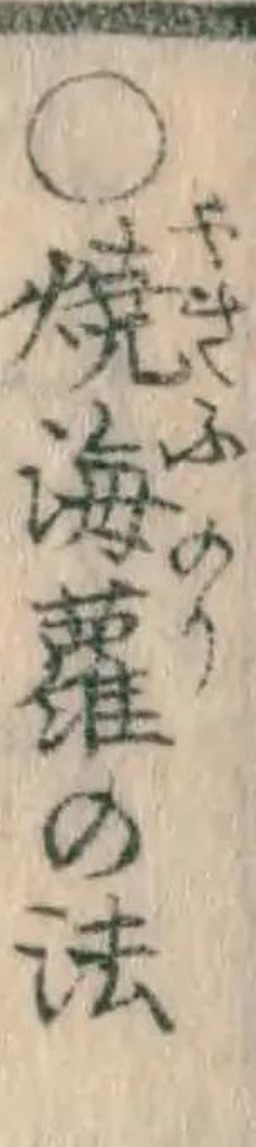○焼海蘿の法
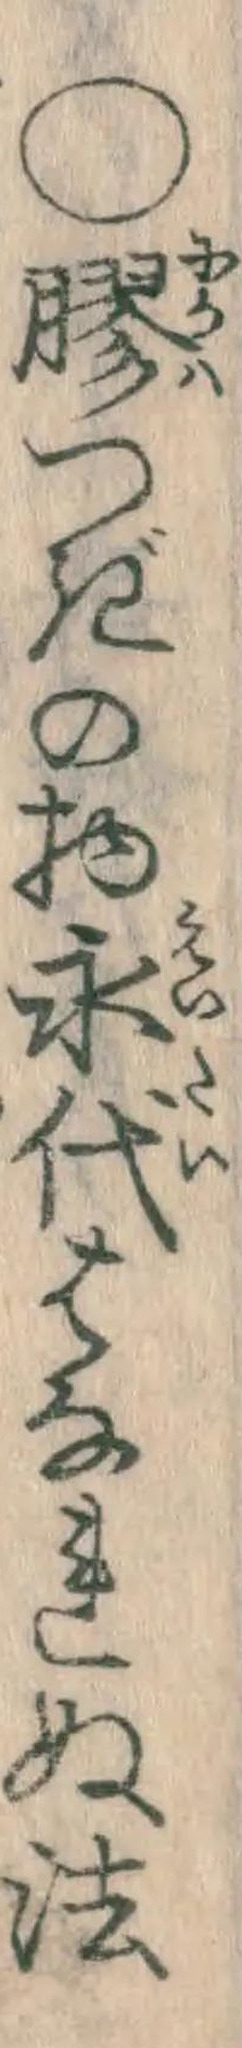○膠つぎの物永代はなれぬ法
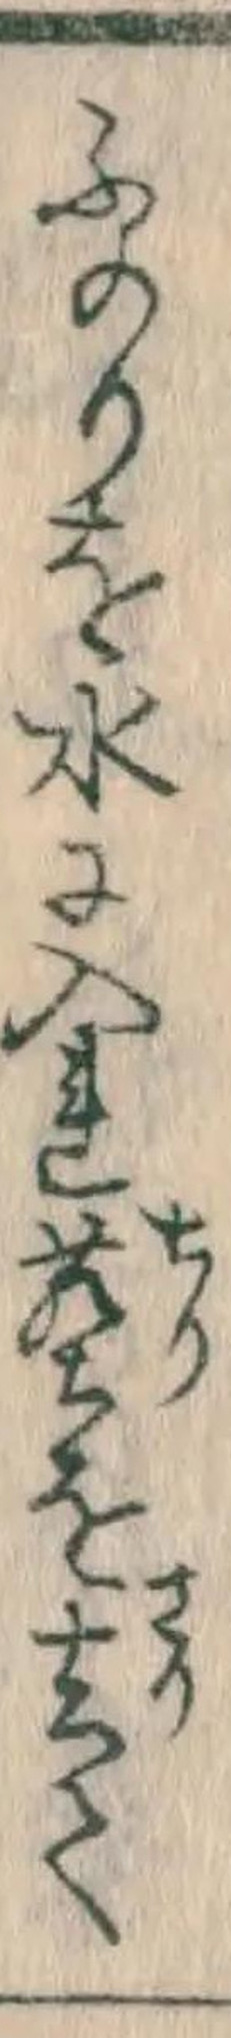ふのりを水に入れ塵を去て
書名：広益秘事大全 3巻. [2]
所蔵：国立国会図書館 National Diet Library, JAPAN
